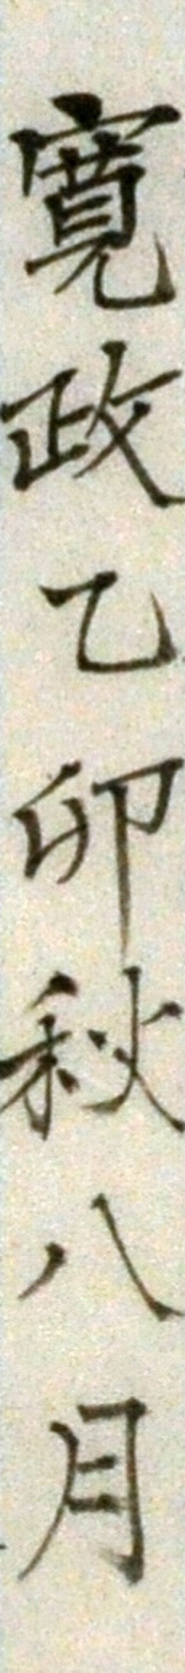寛政乙卯秋八月
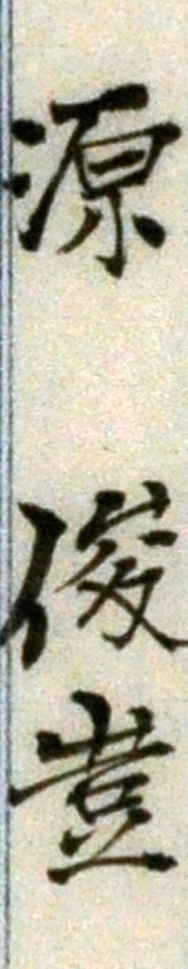源俊堂
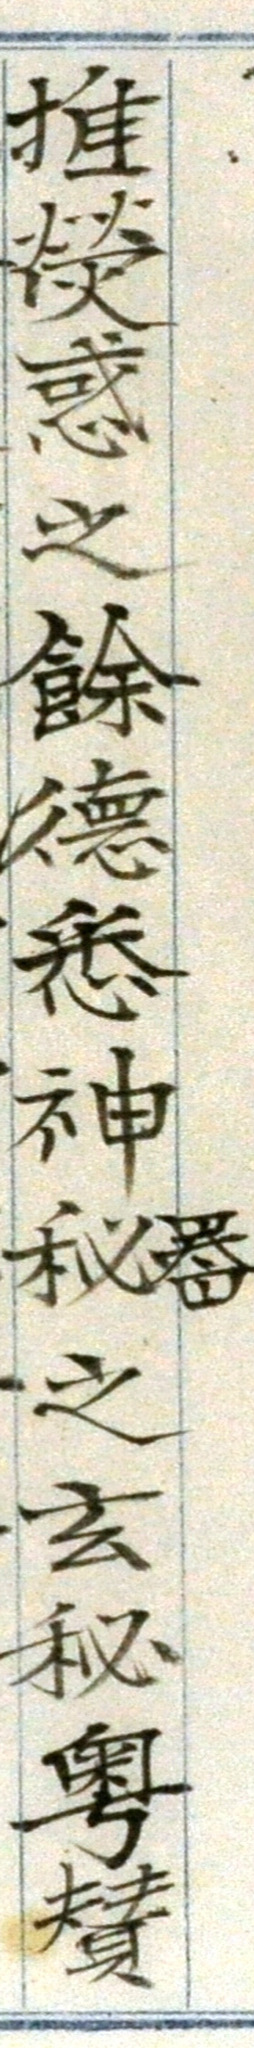推蛍惑之余徳悉神秘之玄秘粤賛
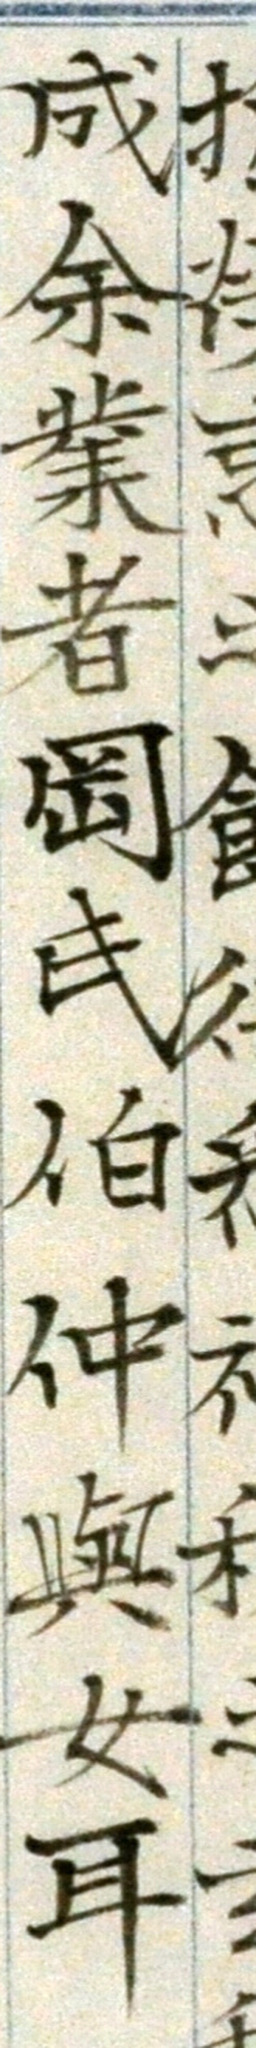成余業者岡氏伯仲与女耳
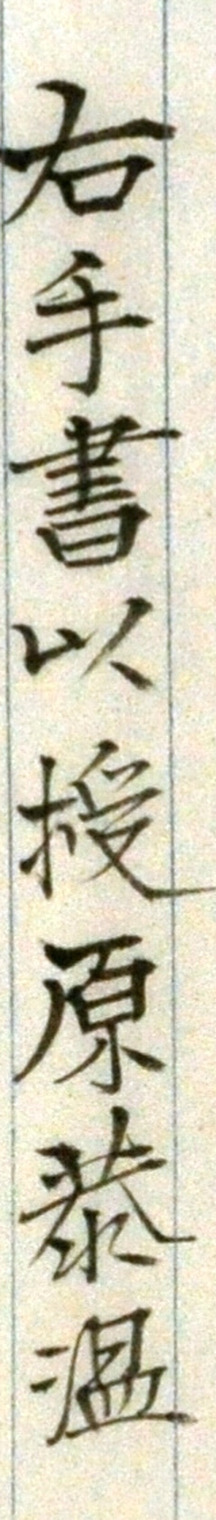右手書以授原恭温

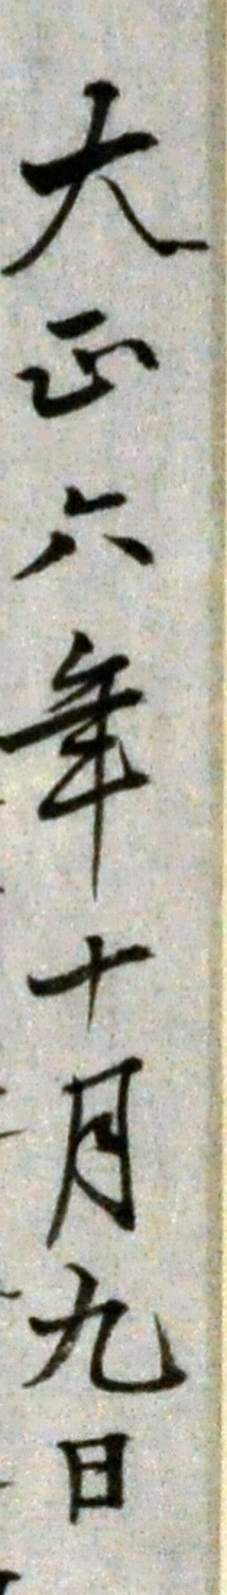大正六年十月九日
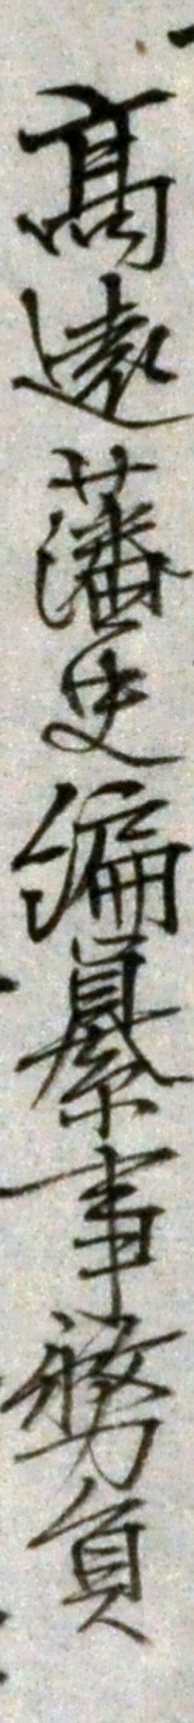高遠藩史編纂事務負
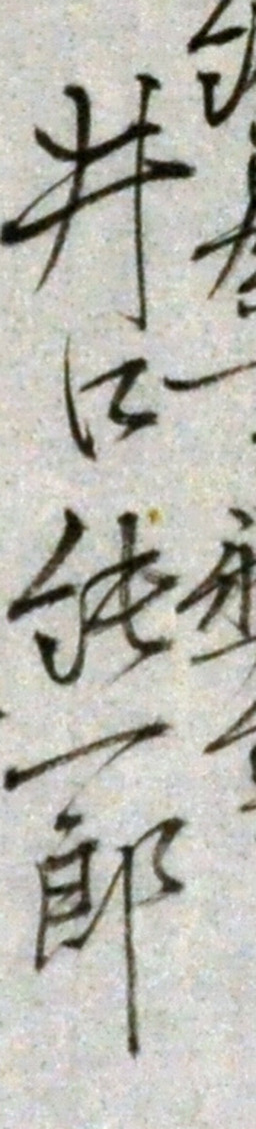井口純一郎
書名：兵律辯
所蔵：伊那市立高遠町図書館・合同会社AMANE
